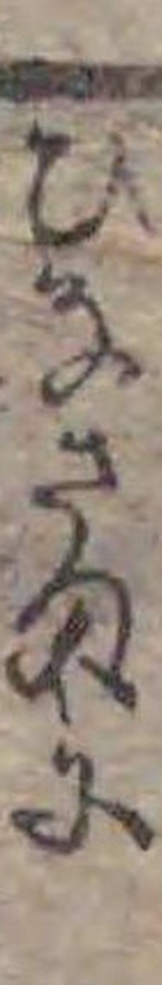ひなさまに
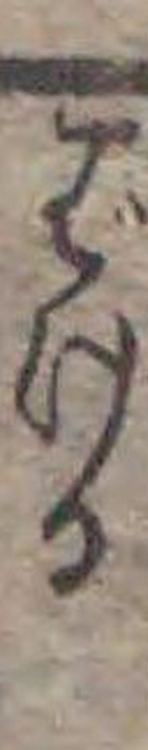ばける
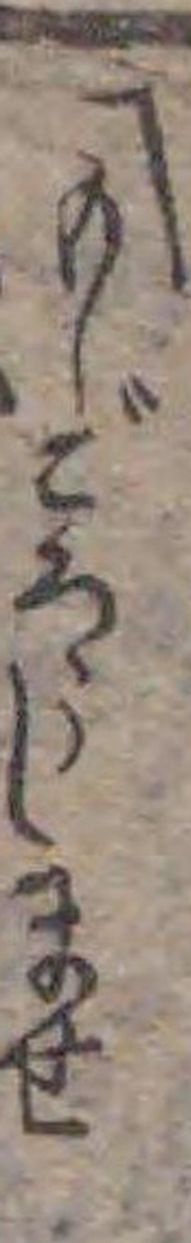〽もしごろうしませ
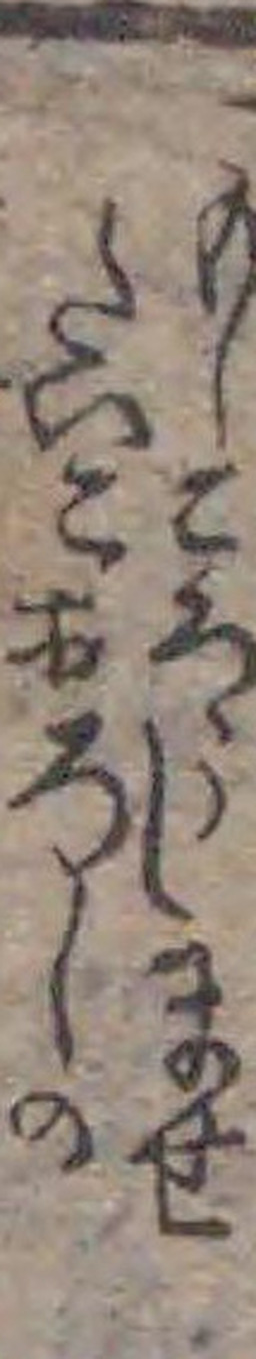たいこおろしの
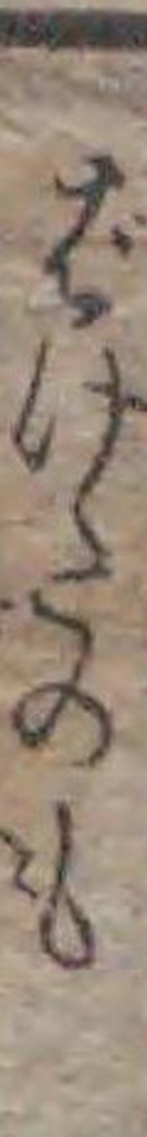ばけたのも
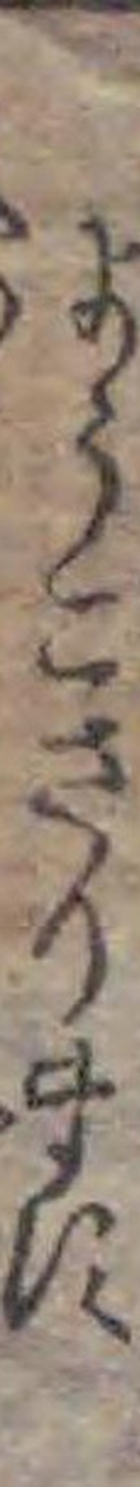ようごさります
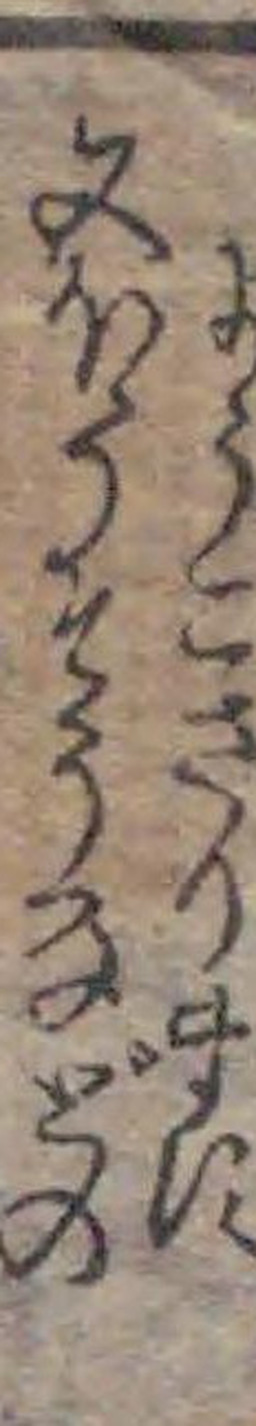又ほうそうなどの
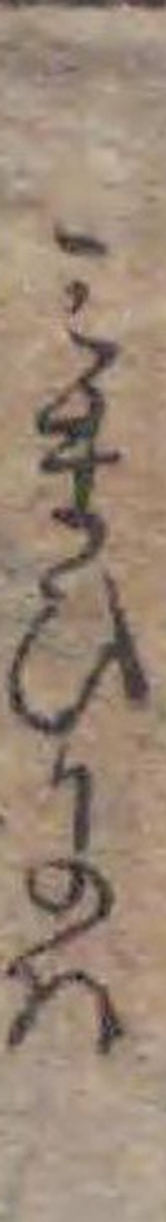みまひには
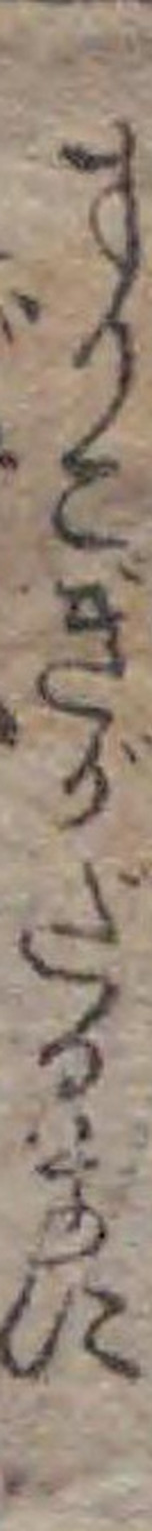すりこぎがだるまに
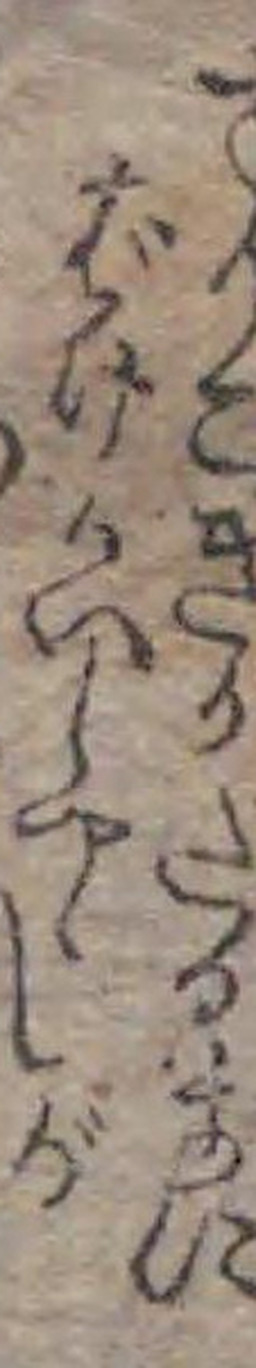ばけかいしやくしが
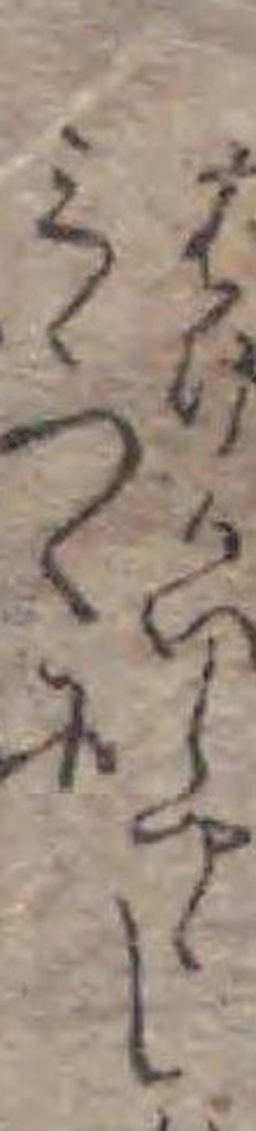みゝつくに
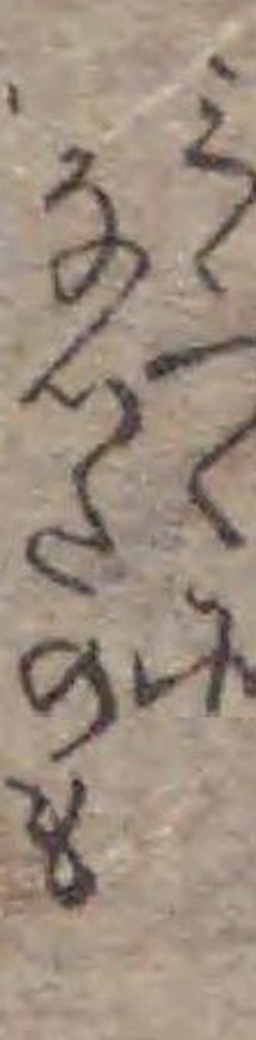なったのも
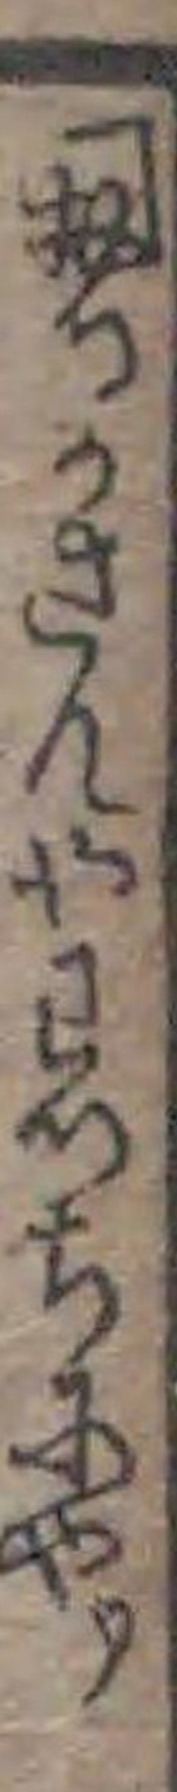〽おつかさんやわつちにやァ
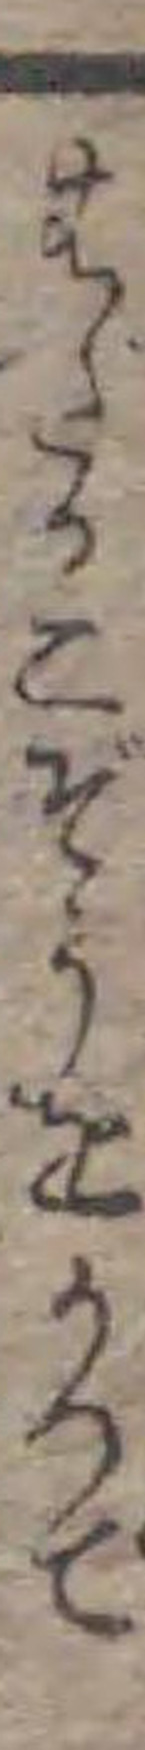はだかこぞうをかつて
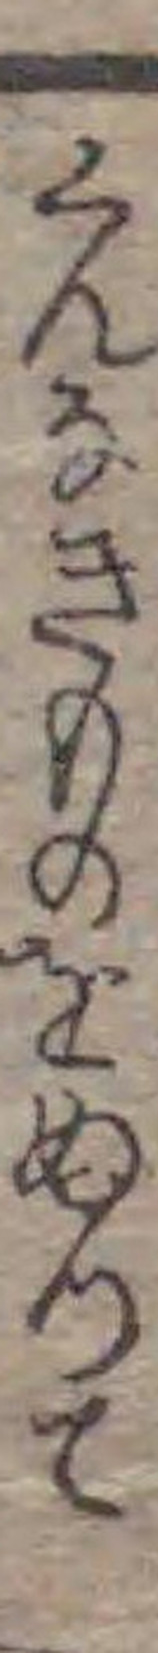くんなきものをぬつて
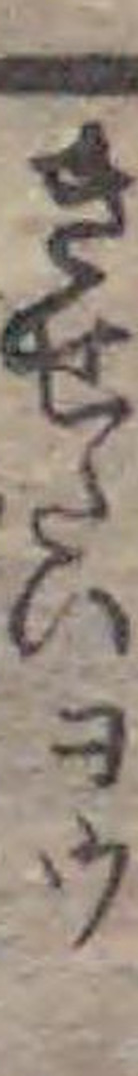きせたいヨウ
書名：年中行状記 : 2巻
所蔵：国立国会図書館 National Diet Library, JAPAN
